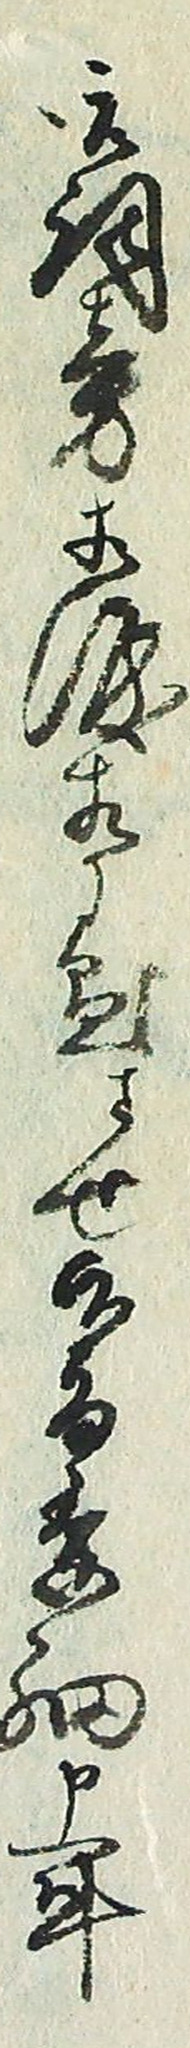取調旁相渡相手懸させ候旨委細申聞
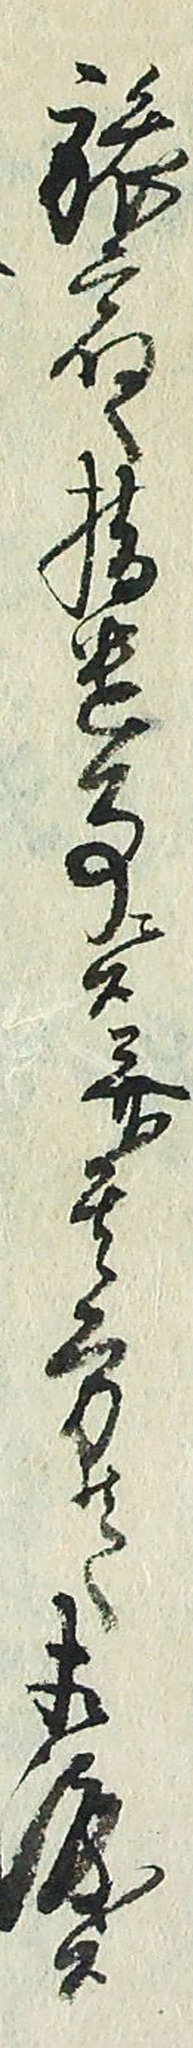旅宿へ指遣事ニ候幷其方共へ相渡候
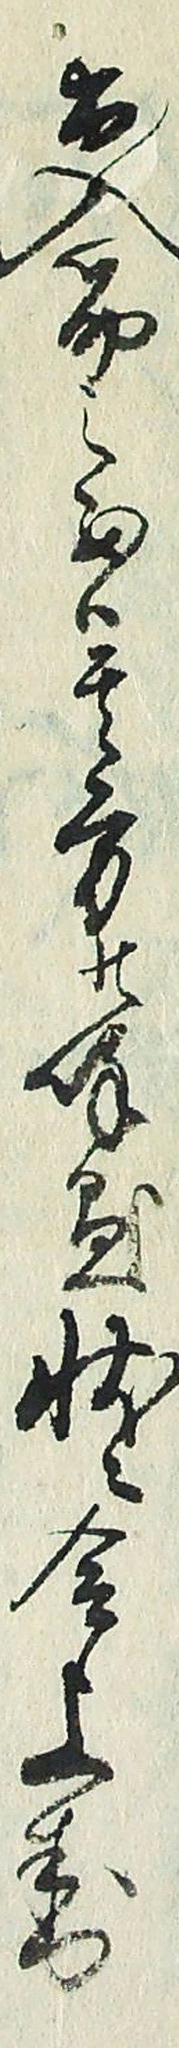出入筋之義ハ其方共呼懸状ニ令上封
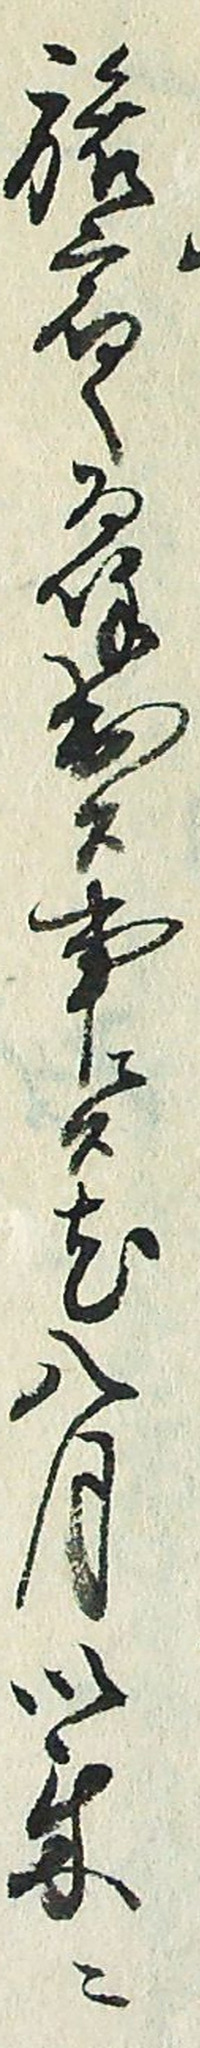旅宿へ為呼出候事ニ候尤八月以来ニ
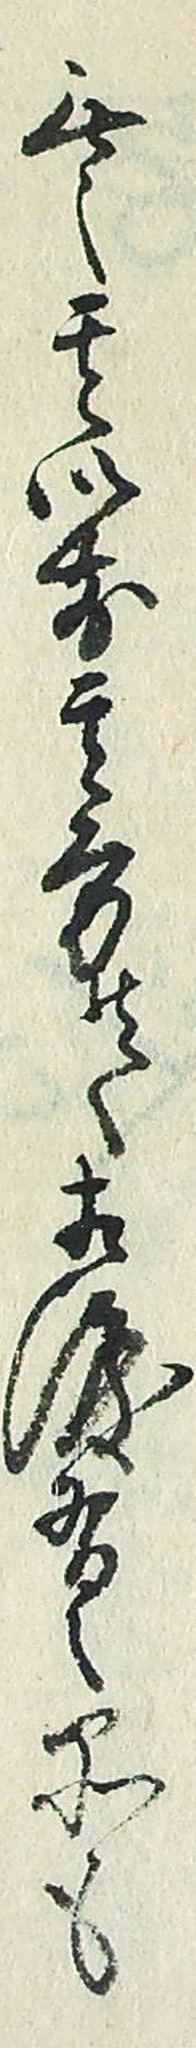無之其以前其方共へ相渡有之品も
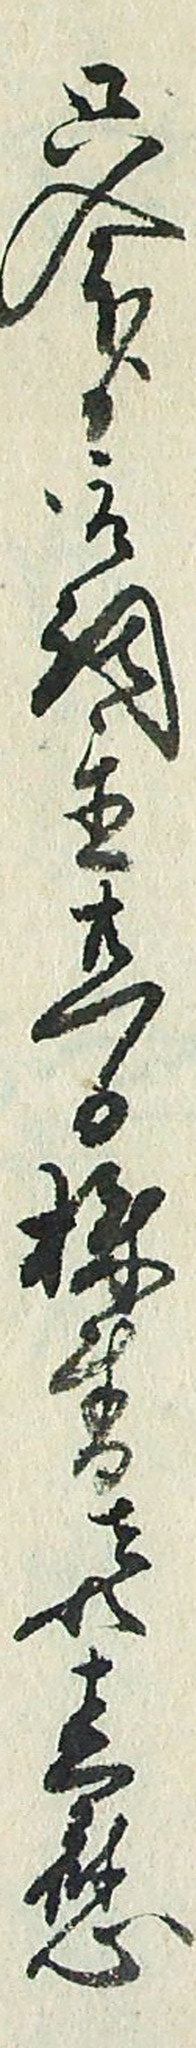只今ゟ取調置廿一日株書を以壱應

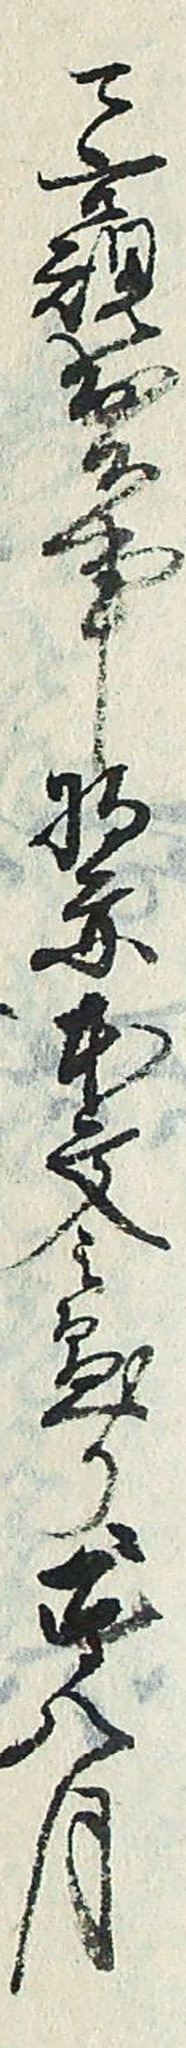可窺出候事将亦本文之懸りニ付八月
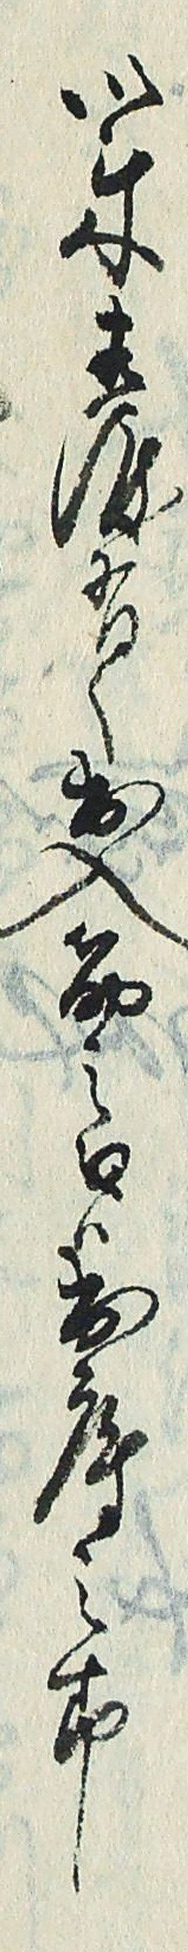以来相渡有之出入筋之義ハ出府之節
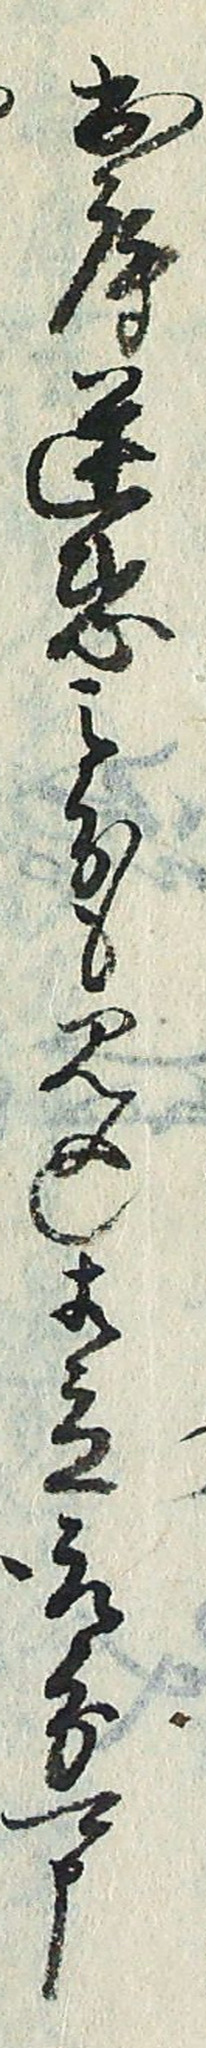出府迷惑之分も見込相立取分可申
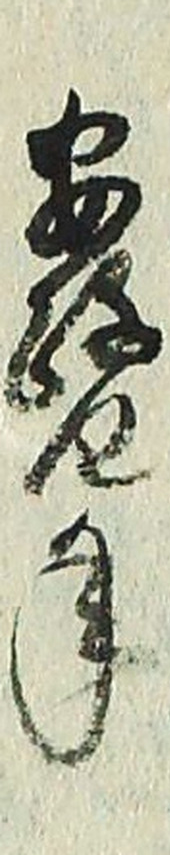安政四年
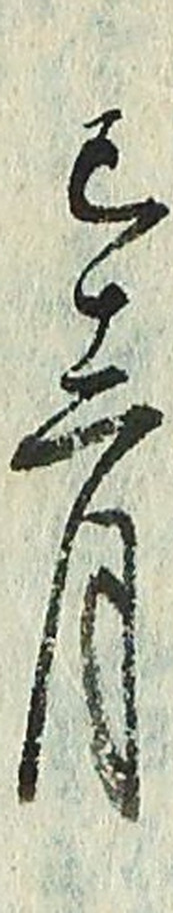巳十二月

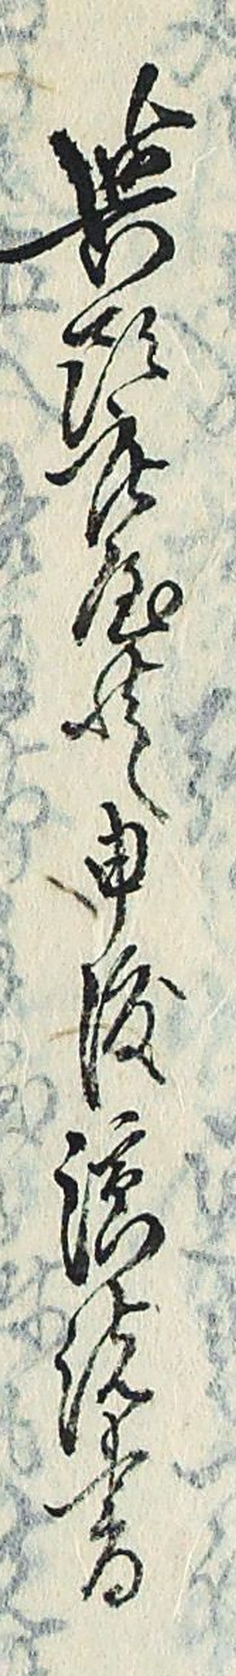與頭庄屋共へ申渡演説書
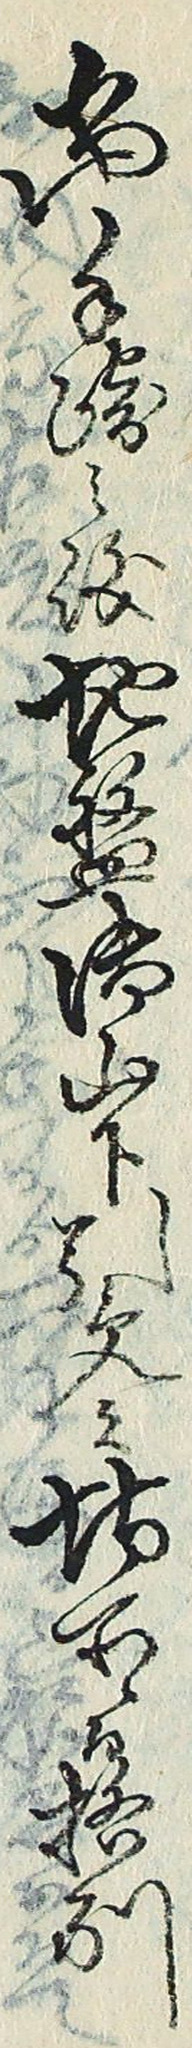當手崎之儀地盤御山下引受候場所ニ而格別
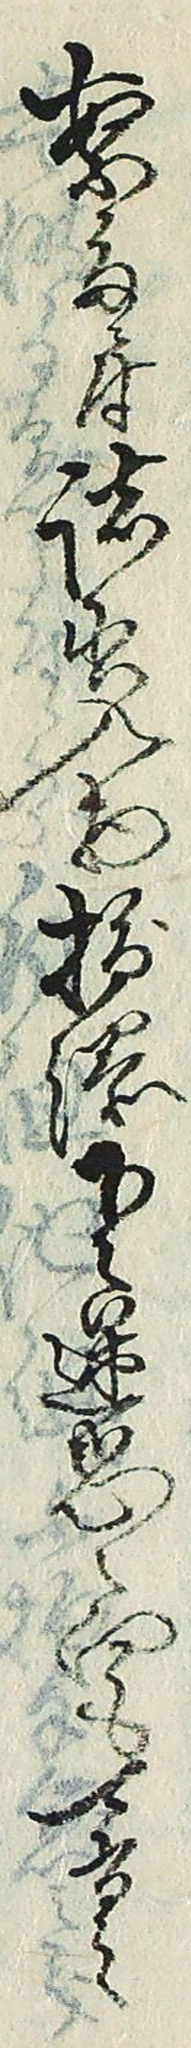繁多ニ付諸出入物指湊下々迷惑之向も可有之
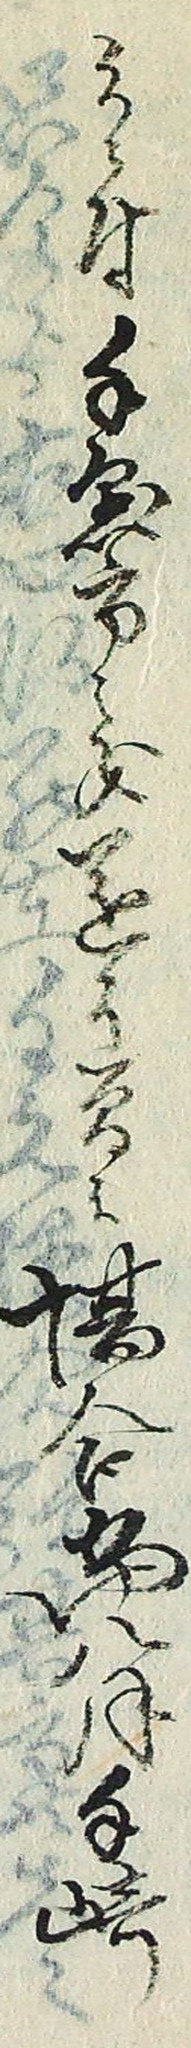候ニ付手懸方之義遂了簡候場合當八月手崎
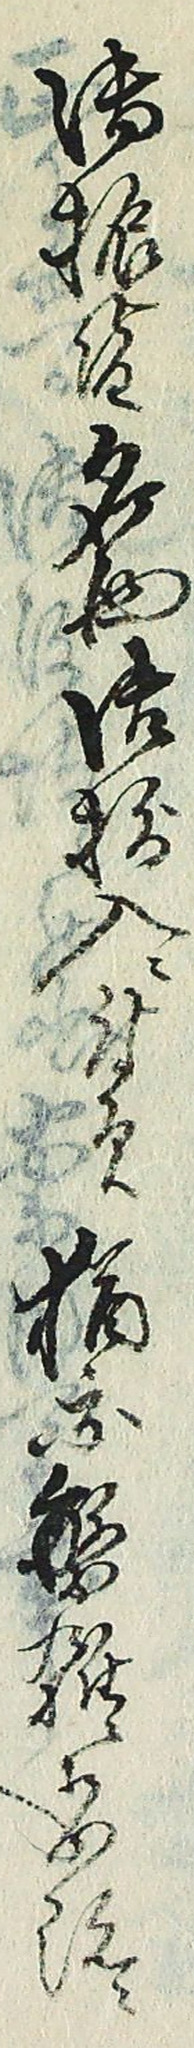御振替名面御指入ニ付而ハ猶亦繁雑ニ相成既ニ
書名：諸御趣意書并御下知向之写
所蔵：鳴門教育大学 Naruto University of Education
